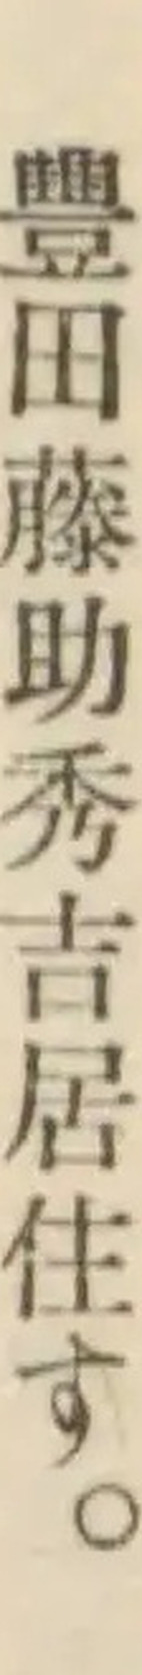豊田藤助秀吉居住す。
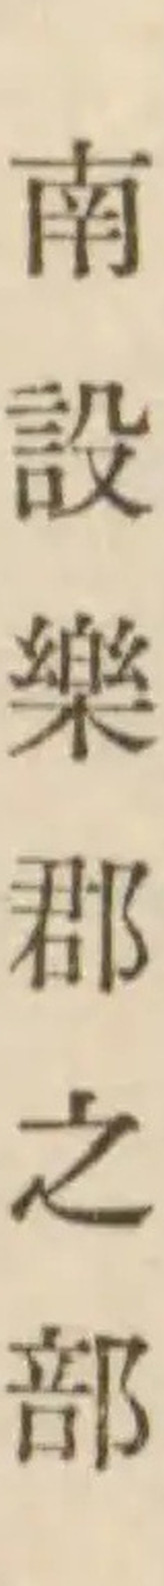南設楽郡之部
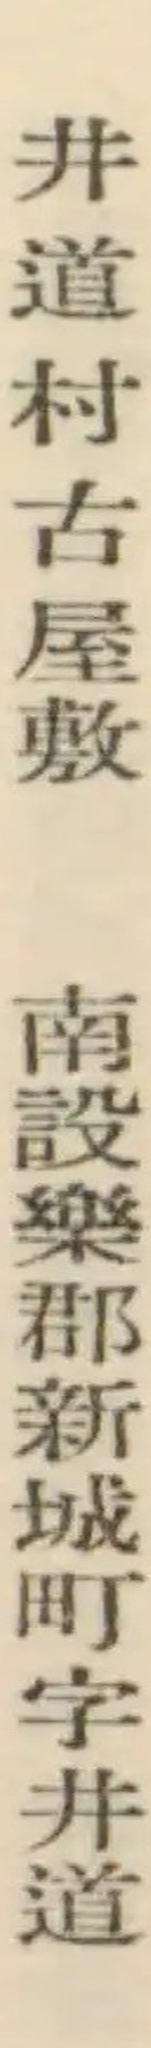井道村古屋敷南設楽郡新城町字井道
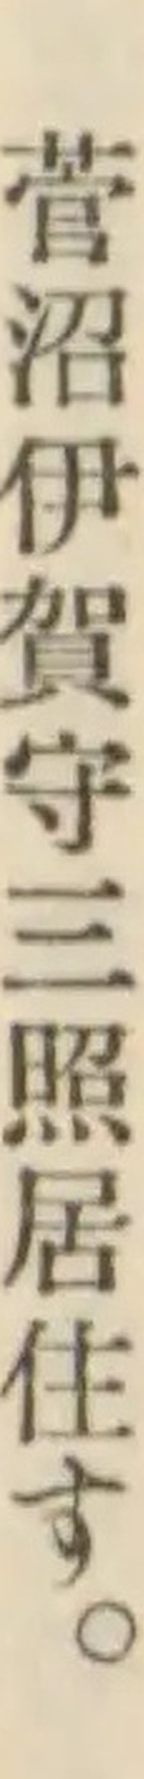菅沼伊賀守三照居住す。
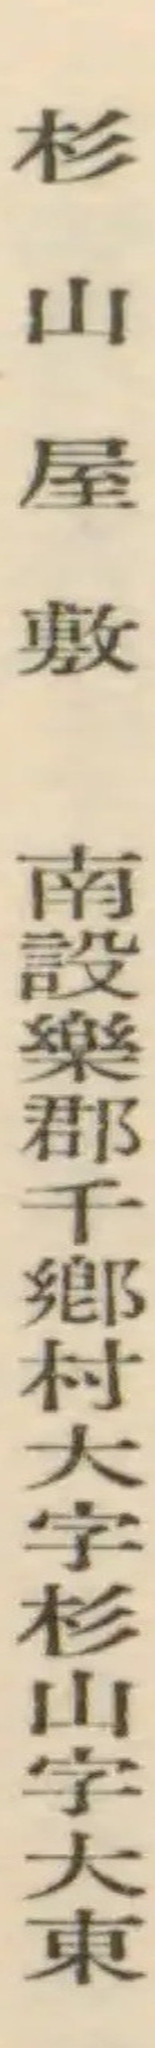杉山屋敷南設楽郡千郷村大字杉山字大東
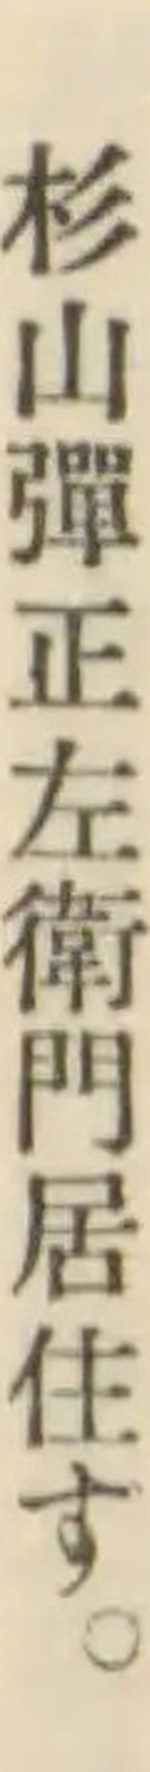杉山弾正左衛門居住す。
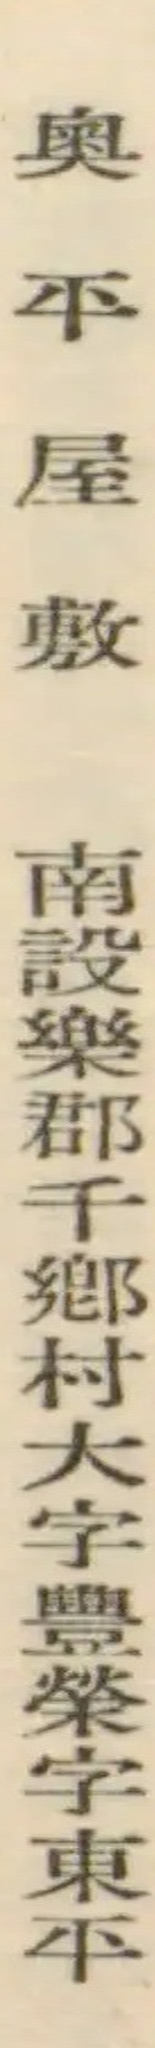奥平屋敷南設楽郡千郷村大字豊栄字東平
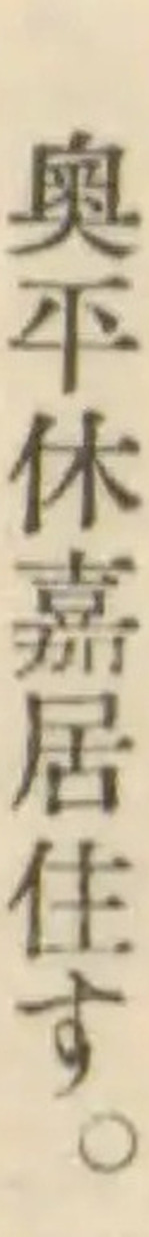奥平休嘉居住す。
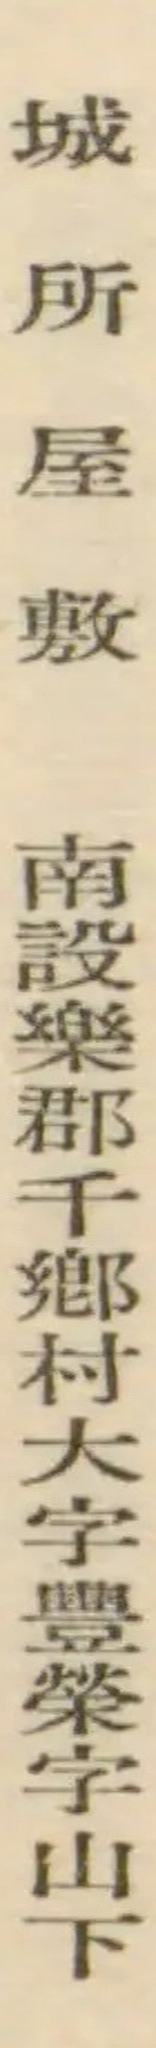城所屋敷南設楽郡千郷村大字豊栄字山下

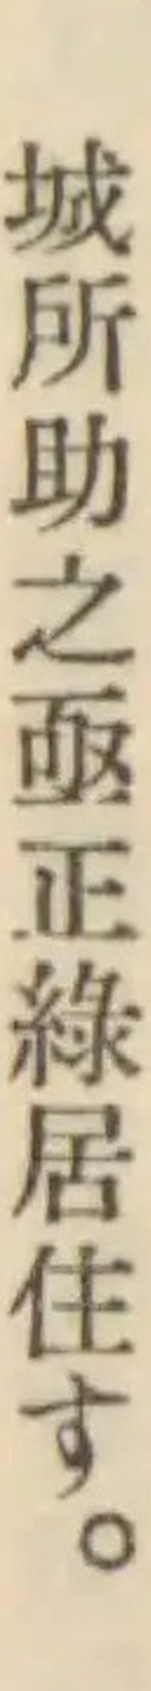城所助之丞正緑居住す。
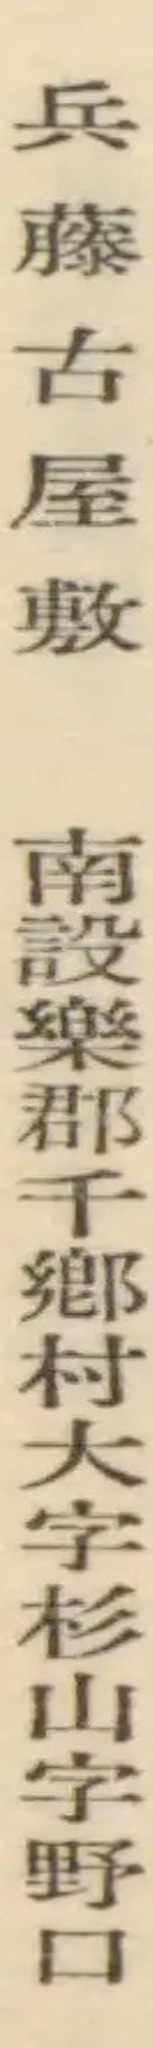兵藤古屋敷南設楽郡千郷村大字杉山字野口
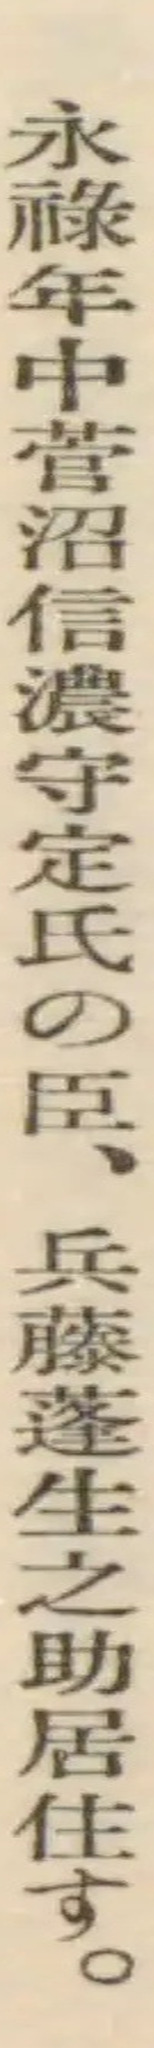永禄年中菅沼信濃守定氏の臣、兵藤蓬生之助居住す。
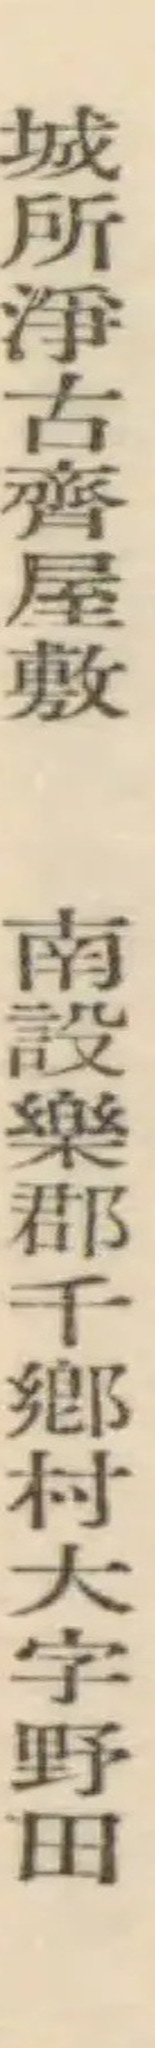城所浄古斉屋敷南設楽郡千郷村大字野田
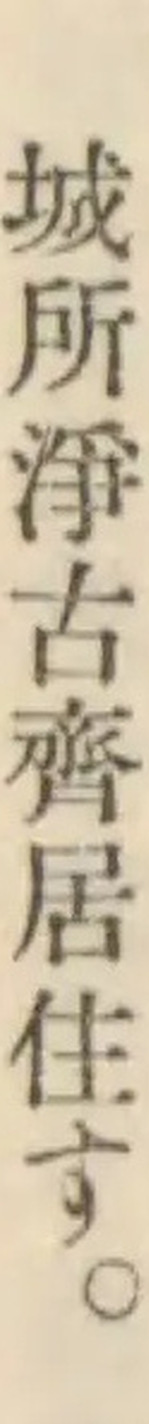城所浄古斉居住す。
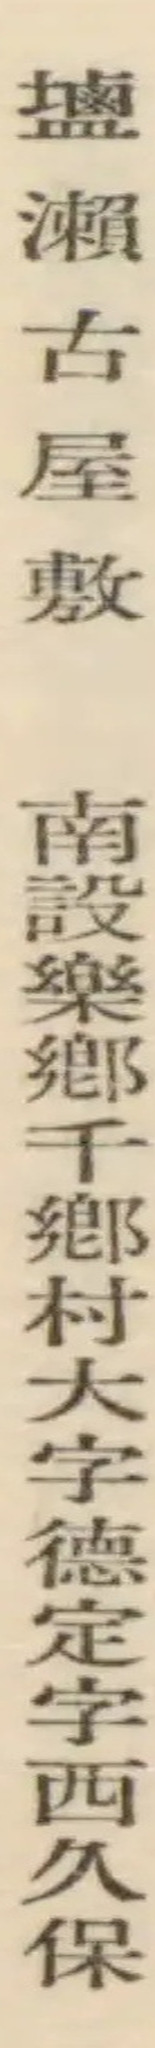塩瀬古屋敷南設楽郡千郷村大字徳定字西久保
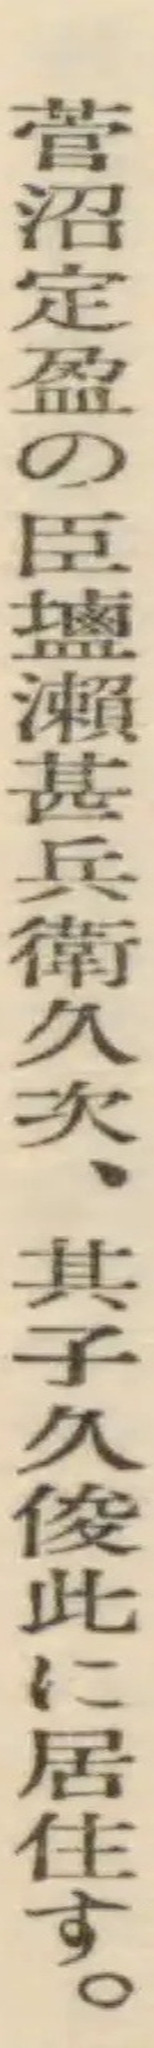菅沼定盈の臣塩瀬甚兵衛久次、其子久俊此に居住す。
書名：東三河之古城
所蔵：国立国会図書館 National Diet Library, JAPAN
